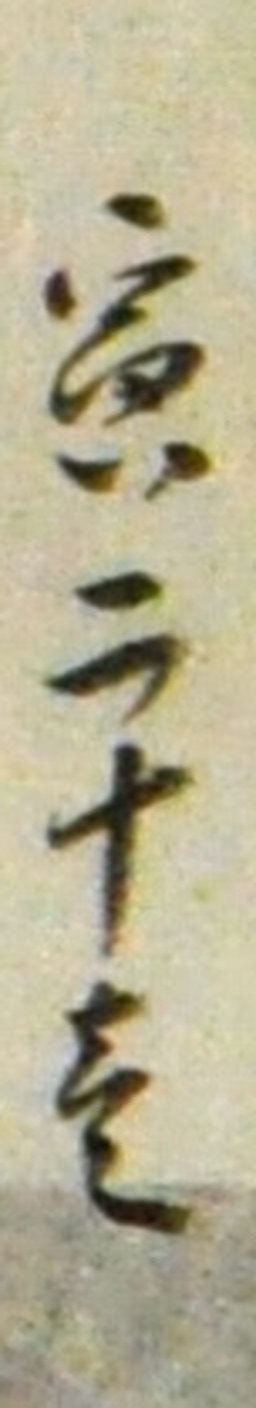寅二十壱
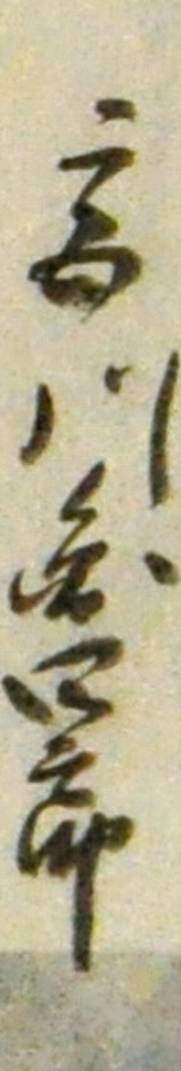宮川円四郎
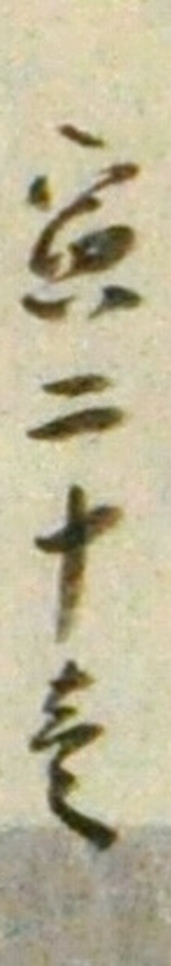寅二十壱
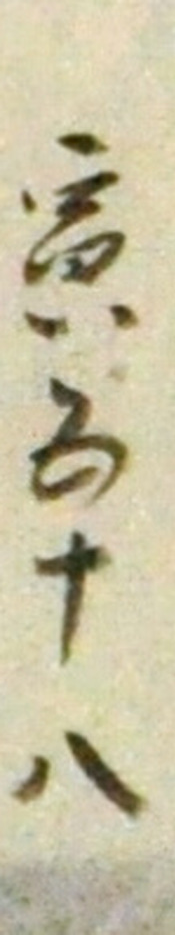寅五十八
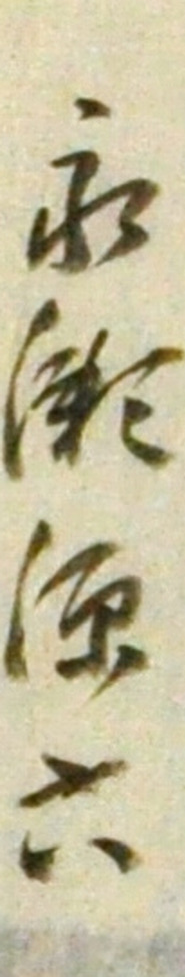永瀬源六
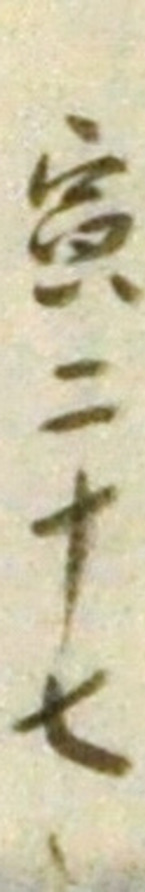寅二十七
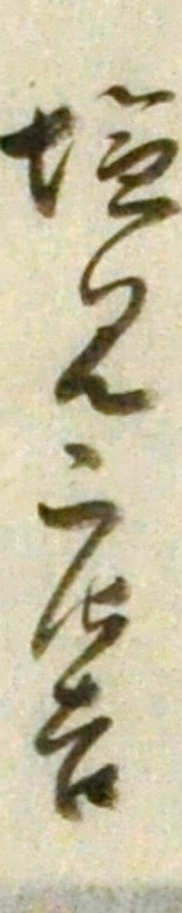塩見庄吉
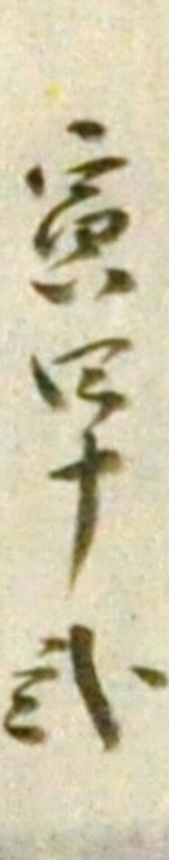寅四十弐
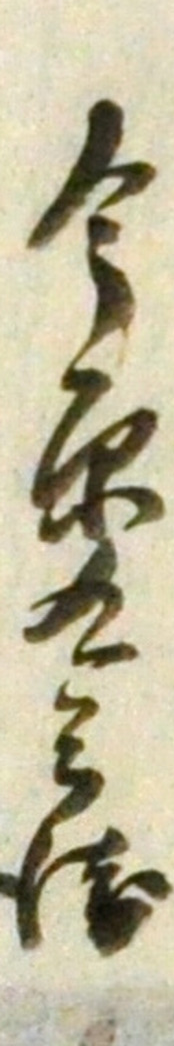今原九兵衛
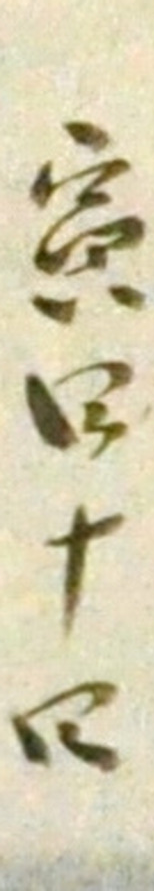寅四十四
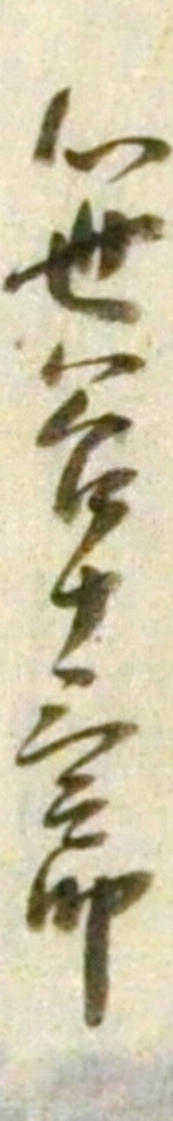笹谷十三郎
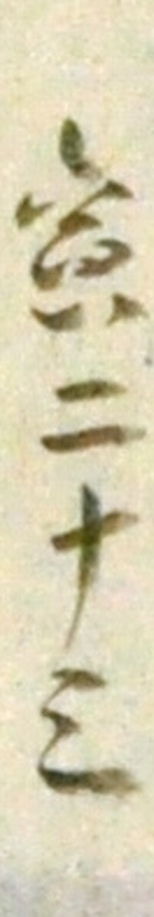寅二十三
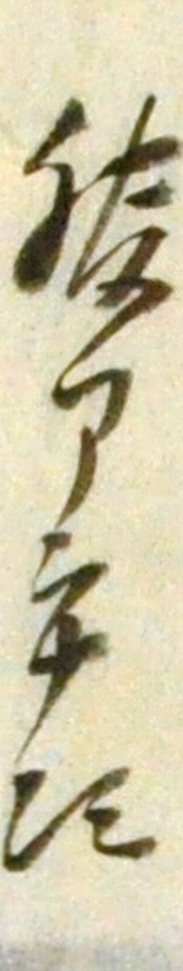服部平次
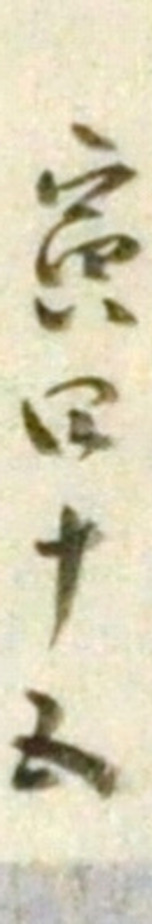寅四十五
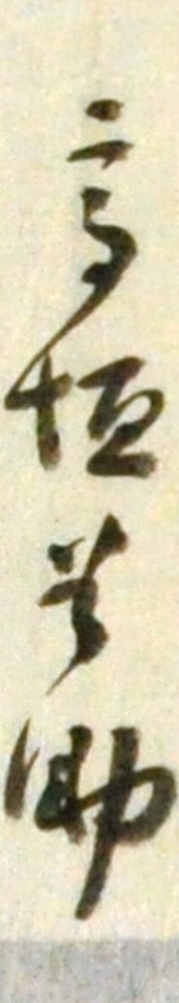高垣兵助
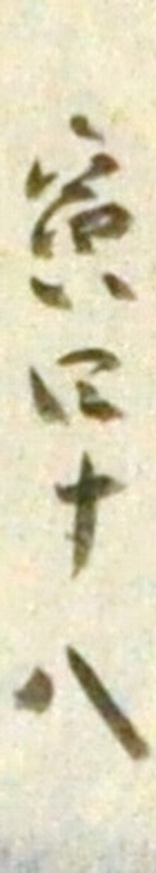寅四十八
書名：罪状判決
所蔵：伊那市立高遠町図書館・合同会社AMANE
